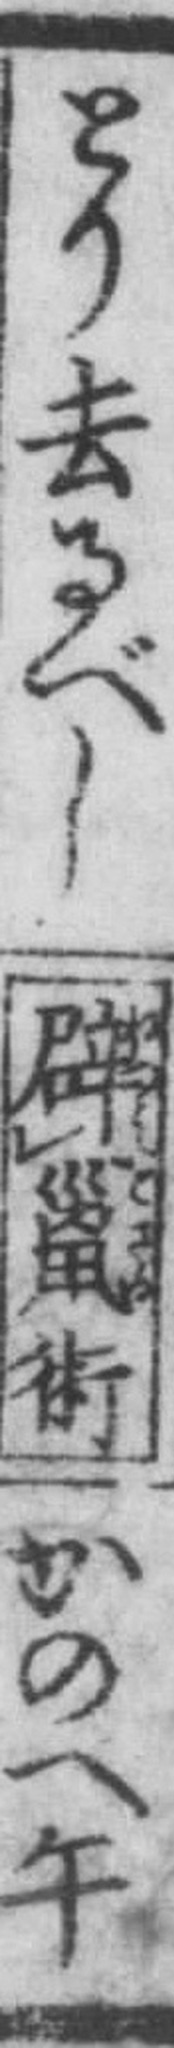とり去るべし辟巤街かのへ午
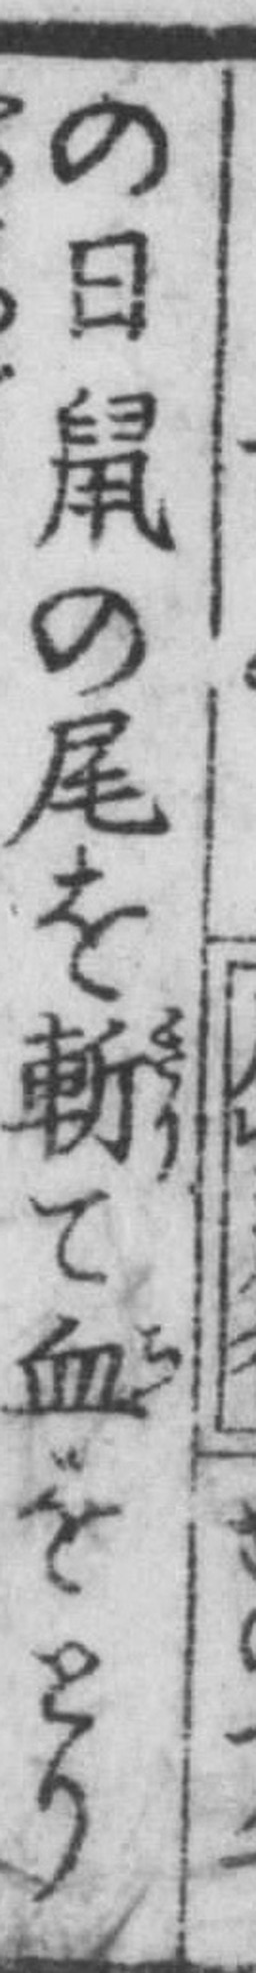の日鼠の尾を斬りて血をとり
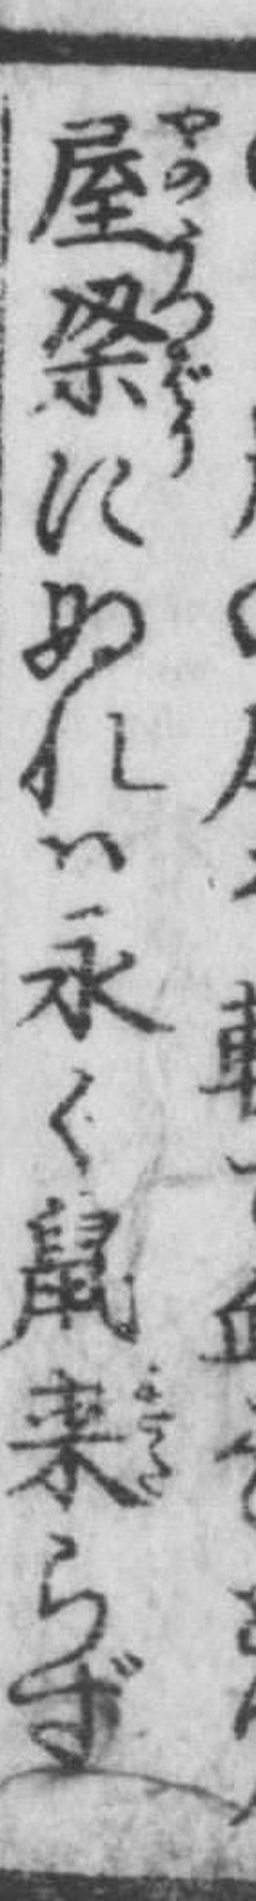屋梁にぬれハ鼠来らず
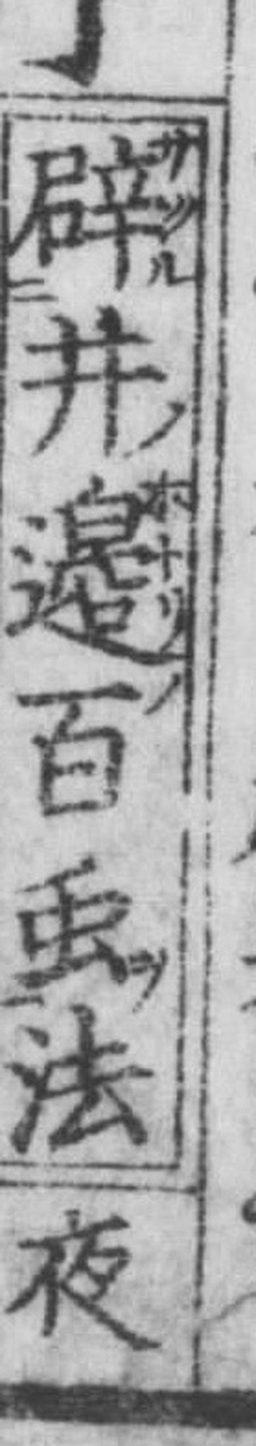辟井邉百足法夜
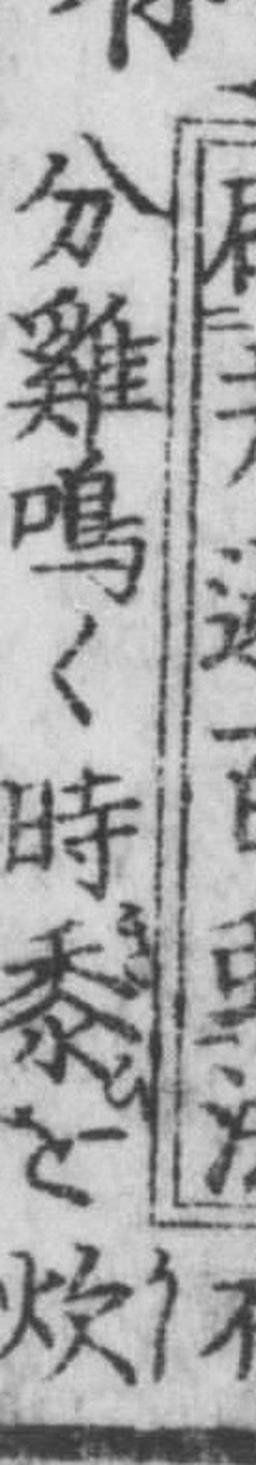分鶏鳴く時黍を炊
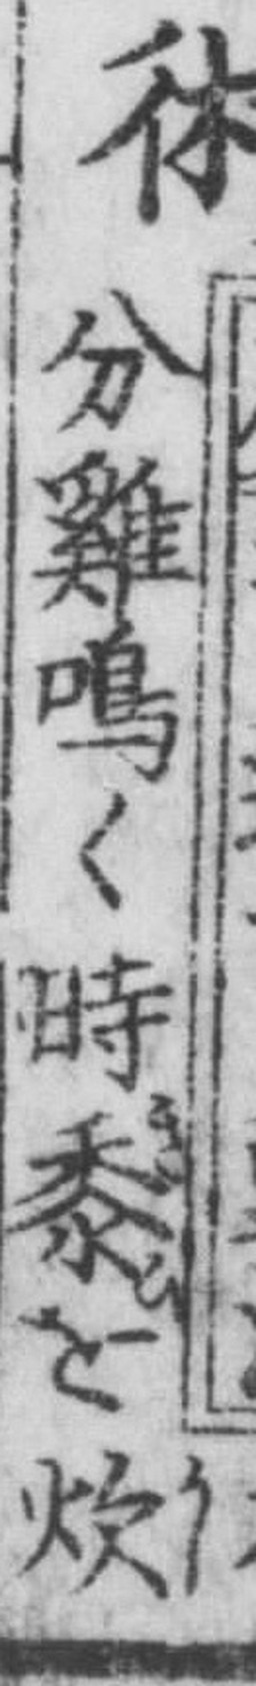分鶏鳴く時黍を炊
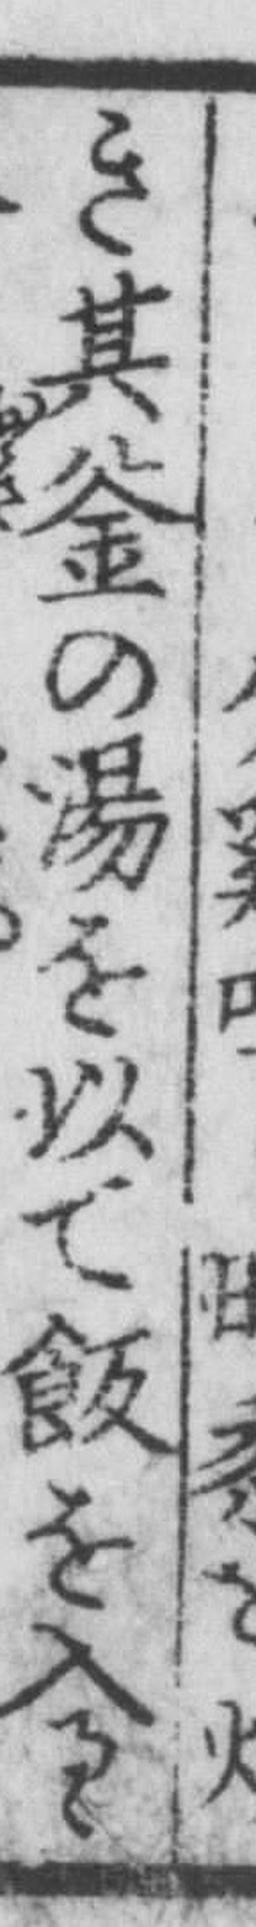き其の釜の湯を以て飯を入るゝ
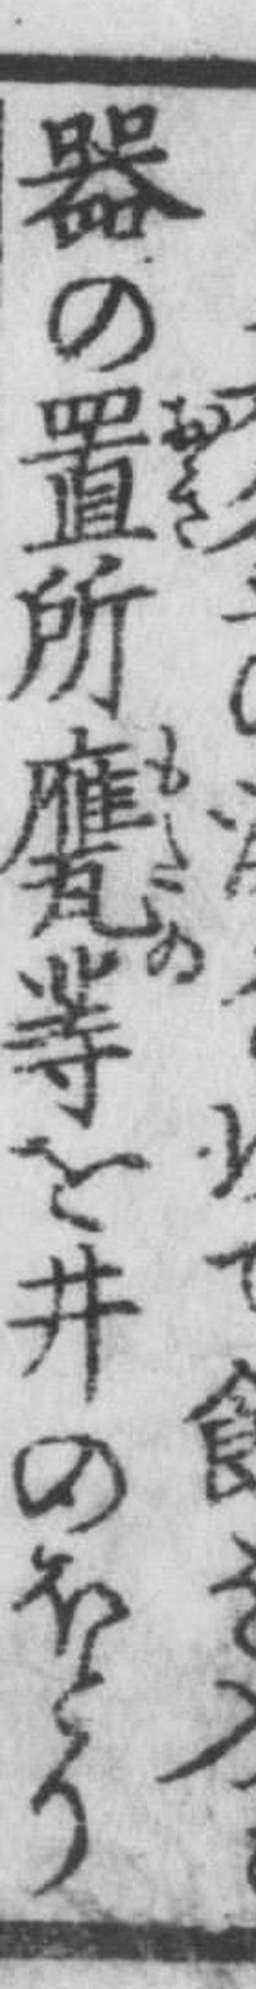器の置き所甕等を井のほとり
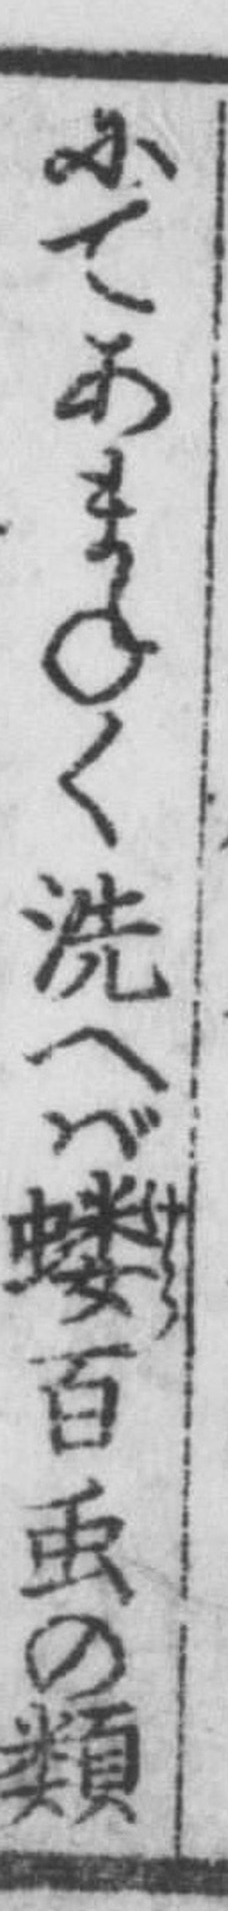にてあまねく洗へバ螻百足の類
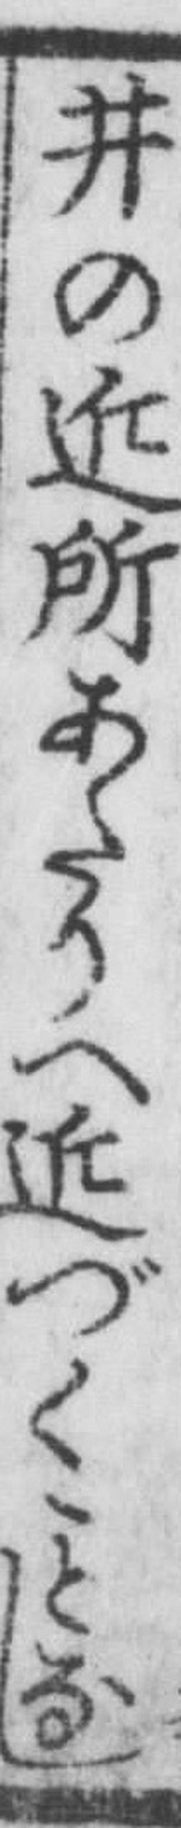井の近所あたりに近づくことなし
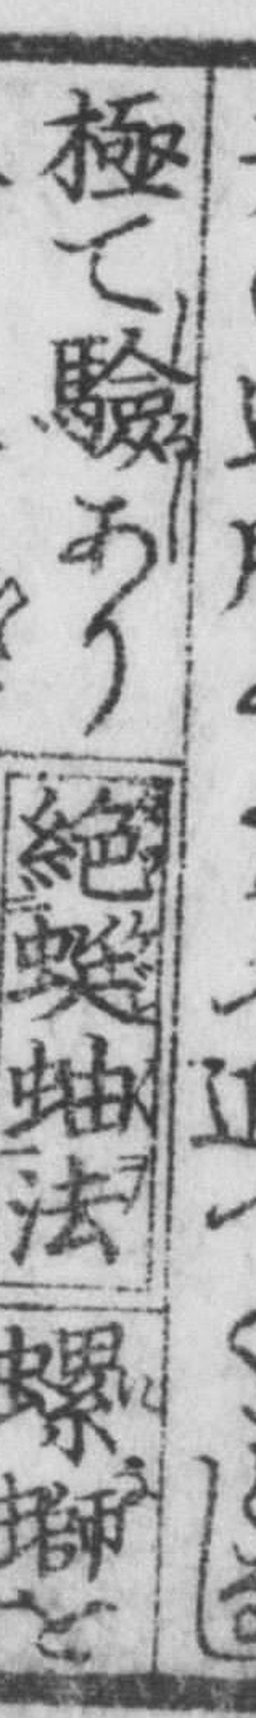極て験あり絶蜒蚰法田螺を
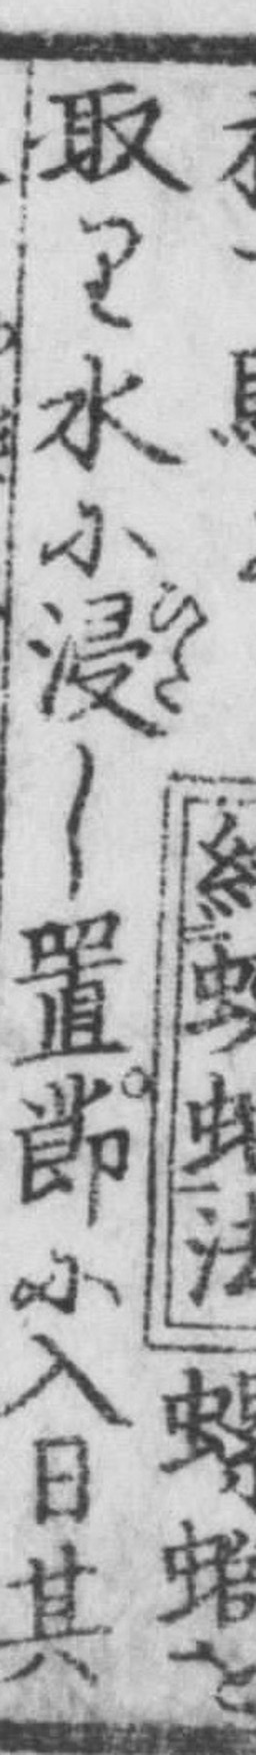取り水に浸し置きに入日其
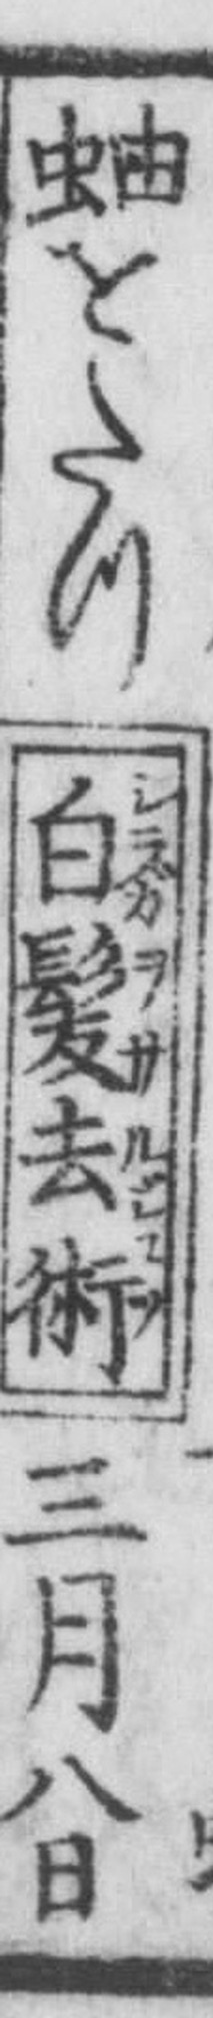蚰をたつ白髪去術三月八日
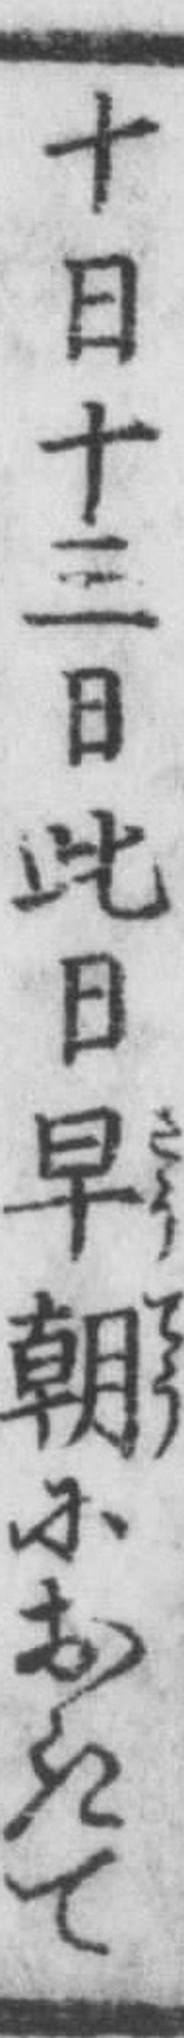十日十三日此日早朝におきて
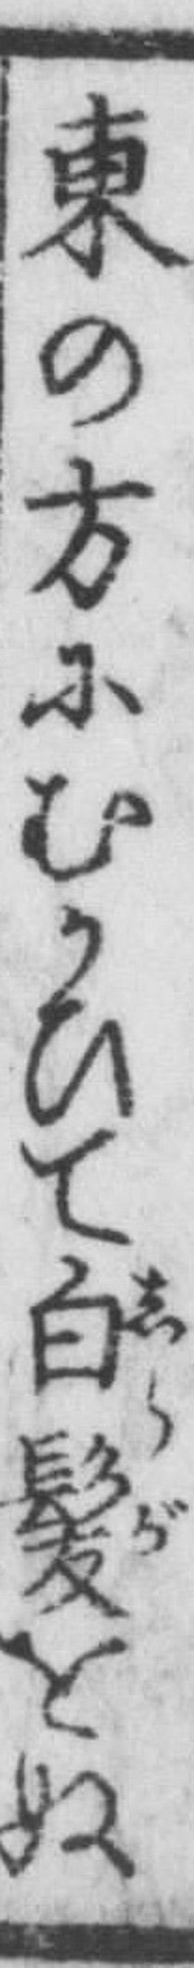東の方にむかひて白髪をぬ
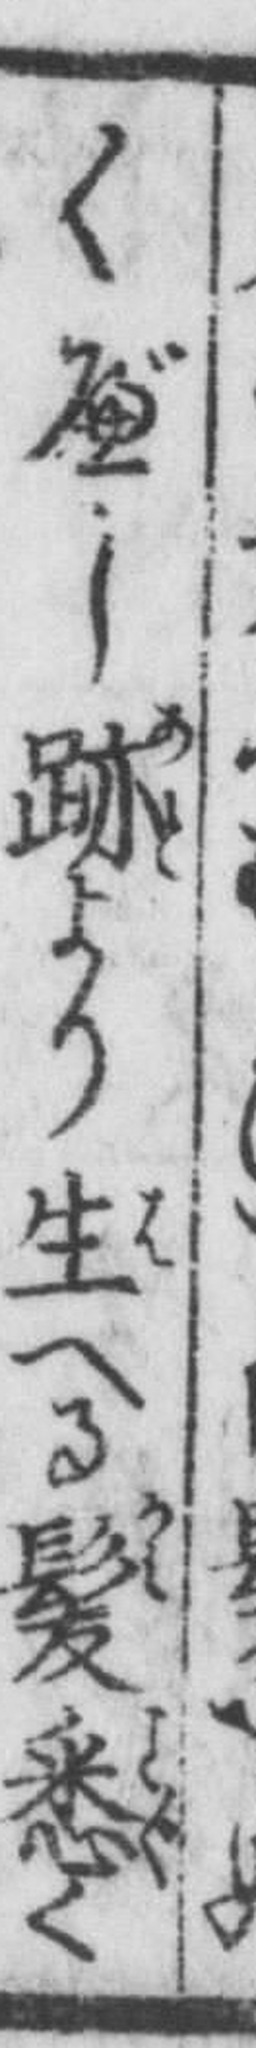くべし跡より生へる髪悉く
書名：当世料理筌
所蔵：大阪府立大学学術情報センター 国文学研究資料館
